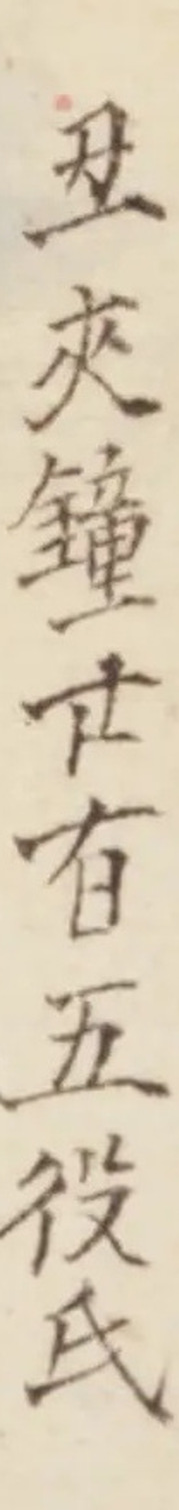丑夾鐘廿有五役氏
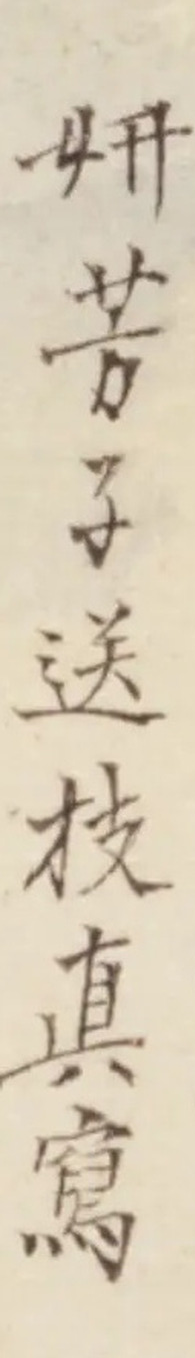妍芳子送枝真寫
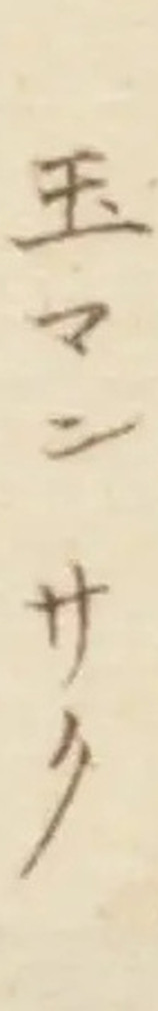玉マンサク
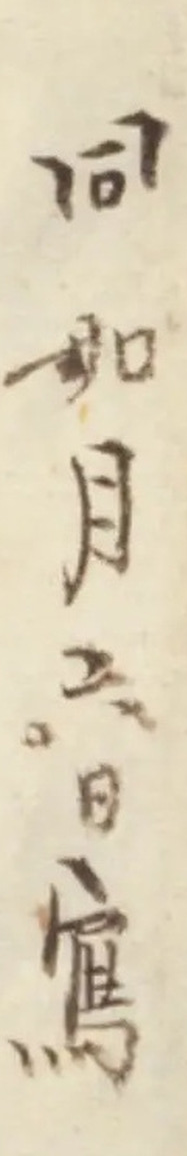同如月六日寫
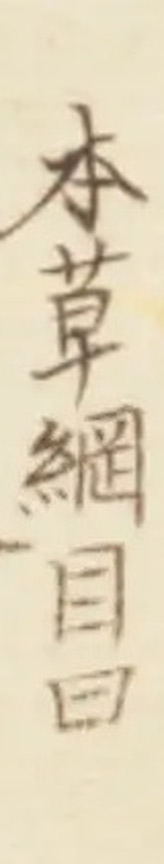本草綱目曰
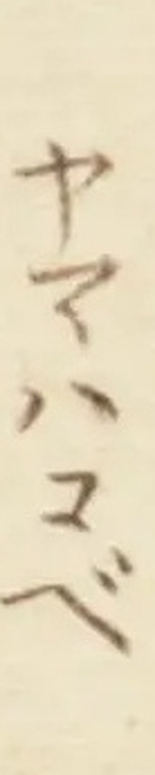ヤマハコベ

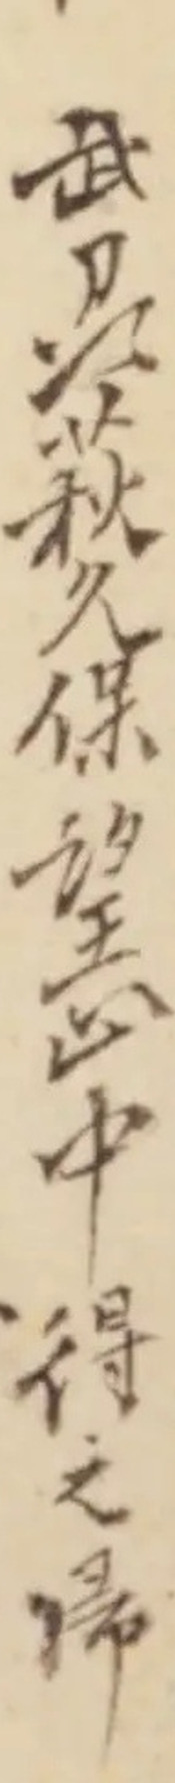武刕萩久保望山中得之帰
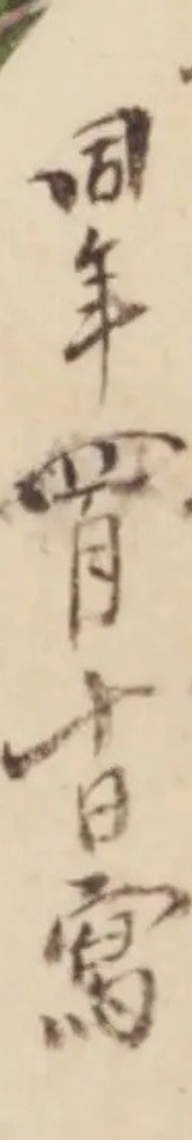同年四月十日寫
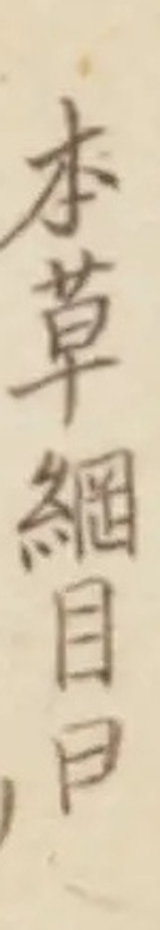本草綱目曰
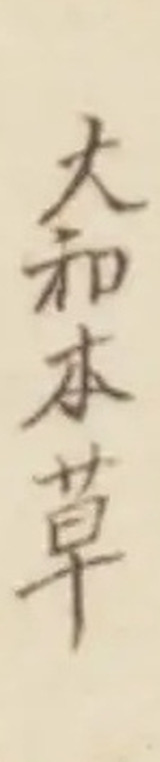大和本草
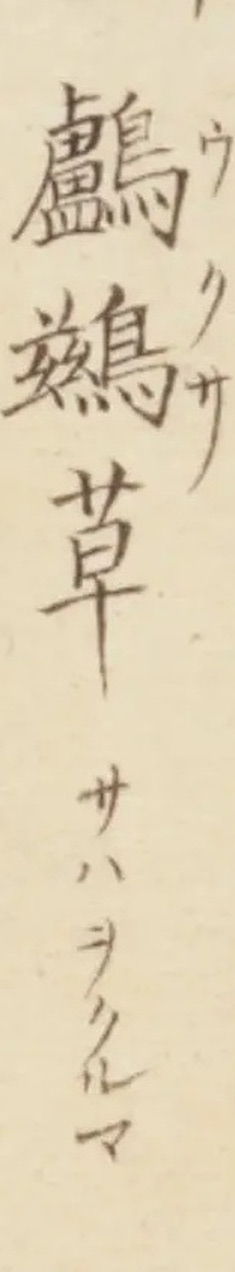靎鶿草サハヲクルマ
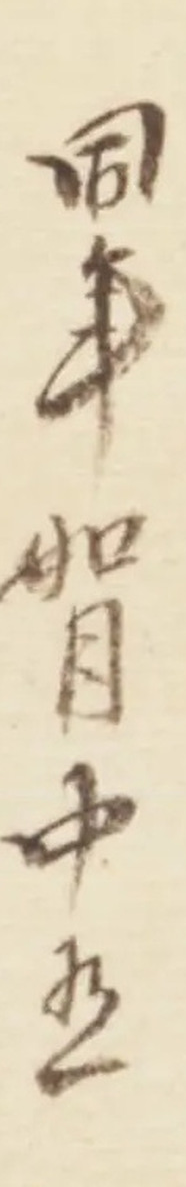同年如月中有

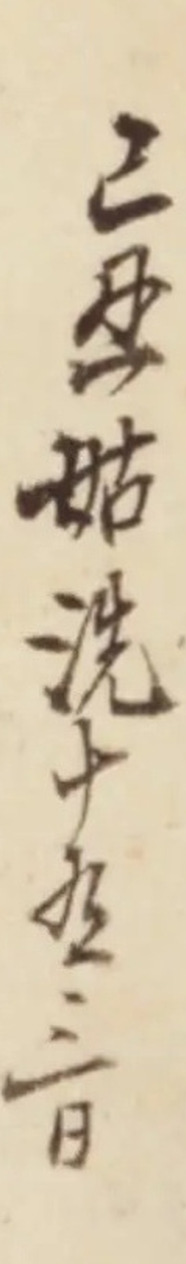乙丑姑洗十有三日
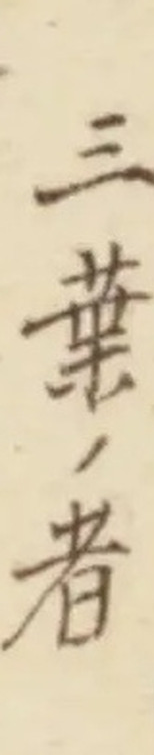三葉の者
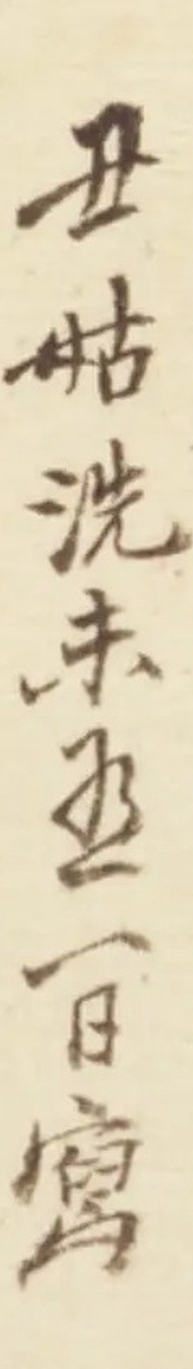丑姑洗未有一日寫
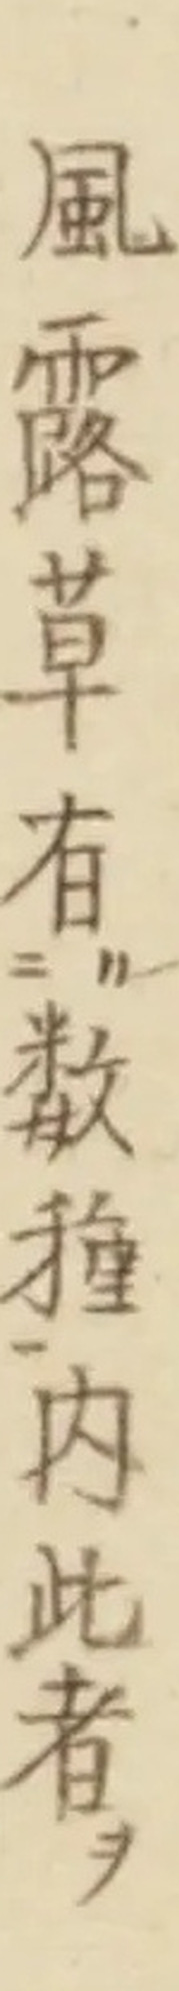風露草有る数種内此者を
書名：梅園草木花譜春之部. 3
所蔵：国立国会図書館 National Diet Library, JAPAN
